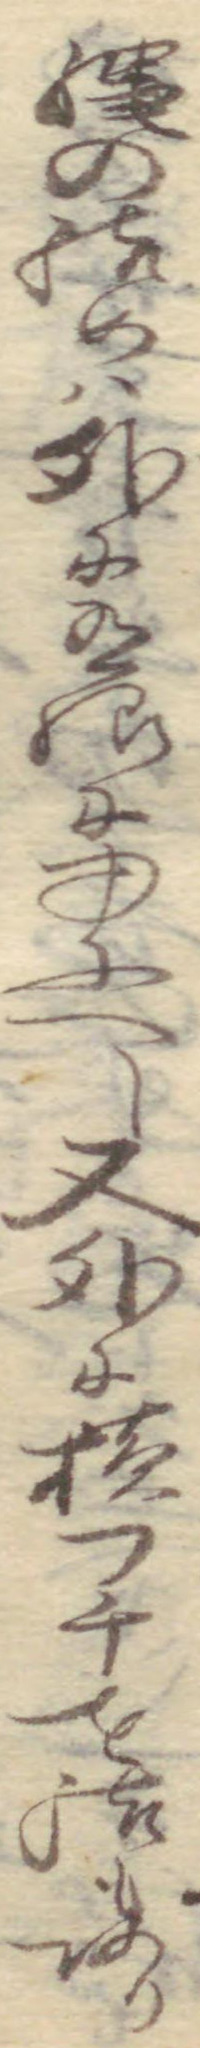縄の結めハ外に有様にゆふへし又外に横フチを結もあり
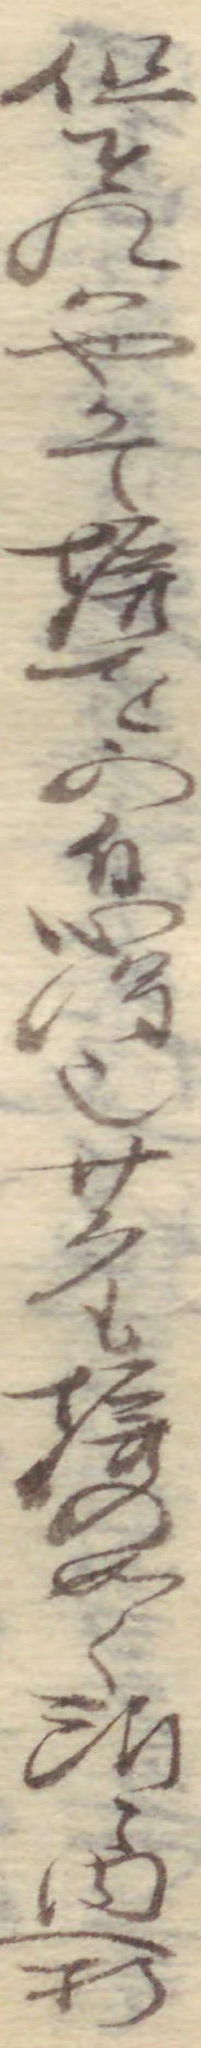但それハやかて塀を可付心得也サクも塀の如く所々うちへ折
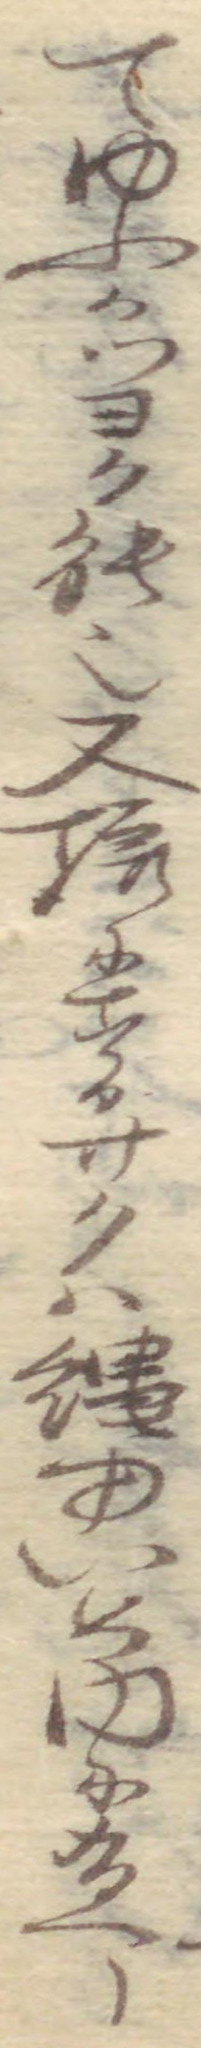てゆふかツヨク能也又塀にするサクハ縄ゆいめ内に有へし
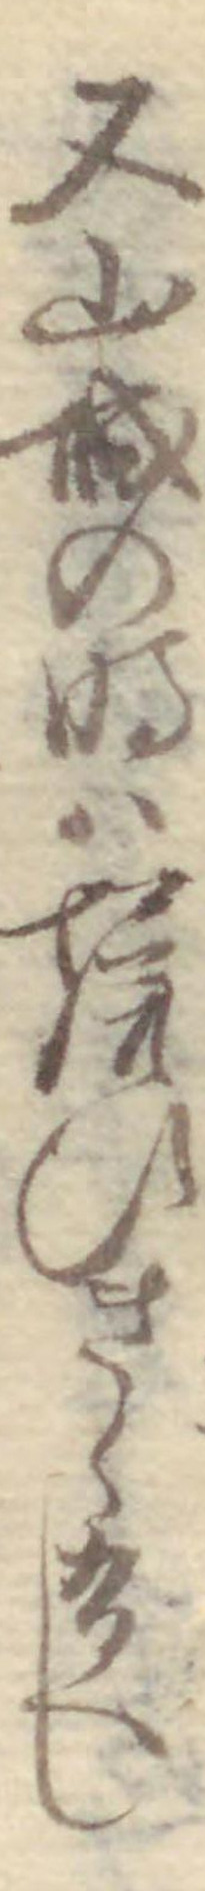又山城の時ハ塀ひきく有へし
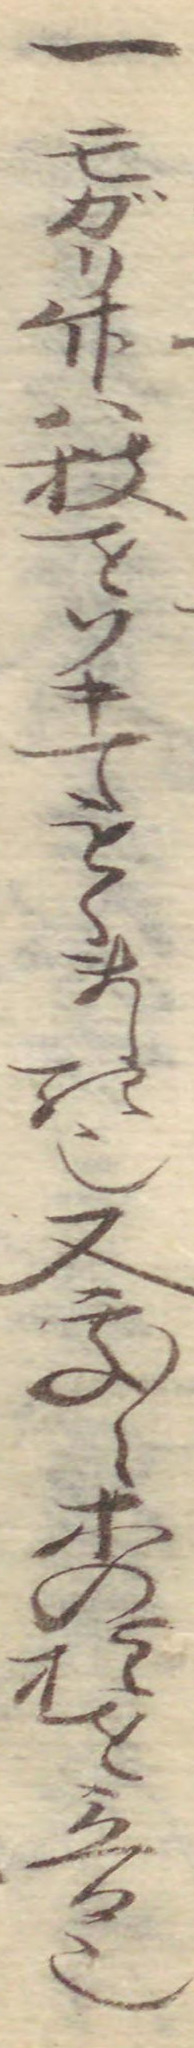一モガリ竹ハ枝をソキてもくましき也又處々木の柱を立る也
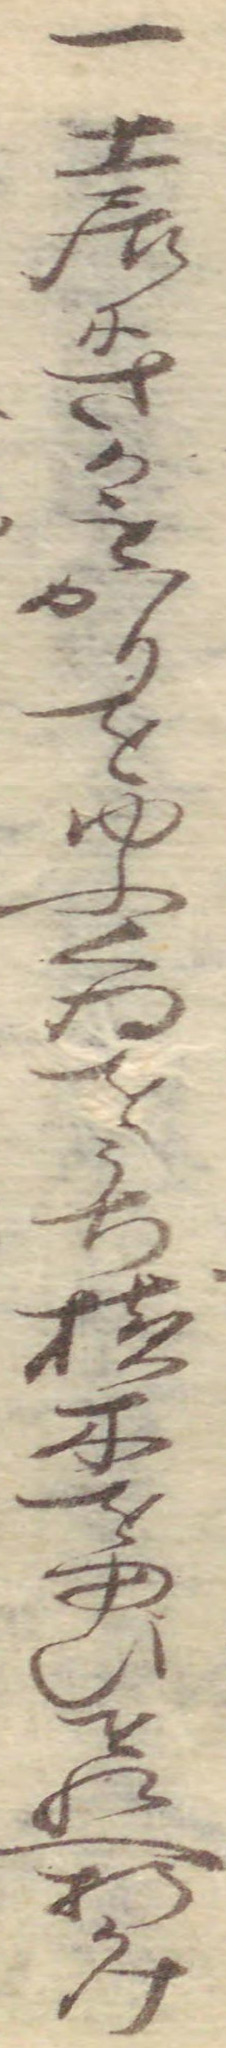一土居にさかもかりをゆふくゐをうち横木をゆひそれへ折かけ
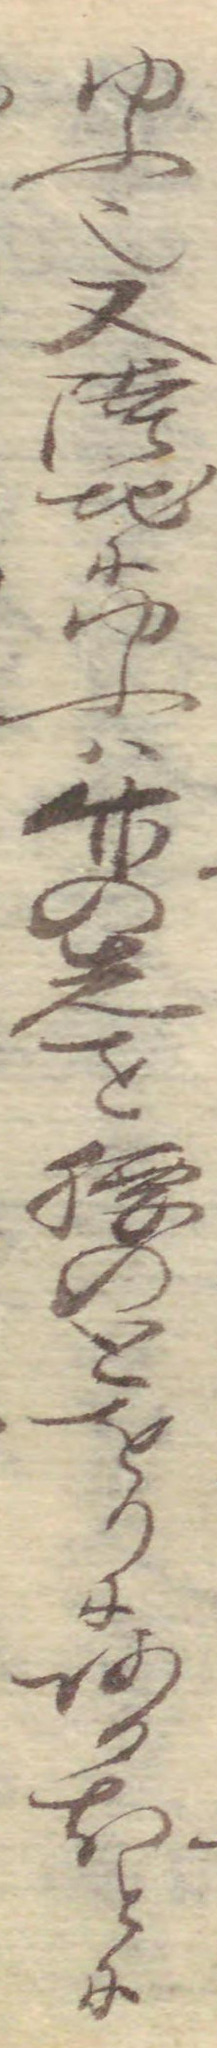ゆふ也又陸地にゆふハ竹の先を腰のとをりにあるほとに
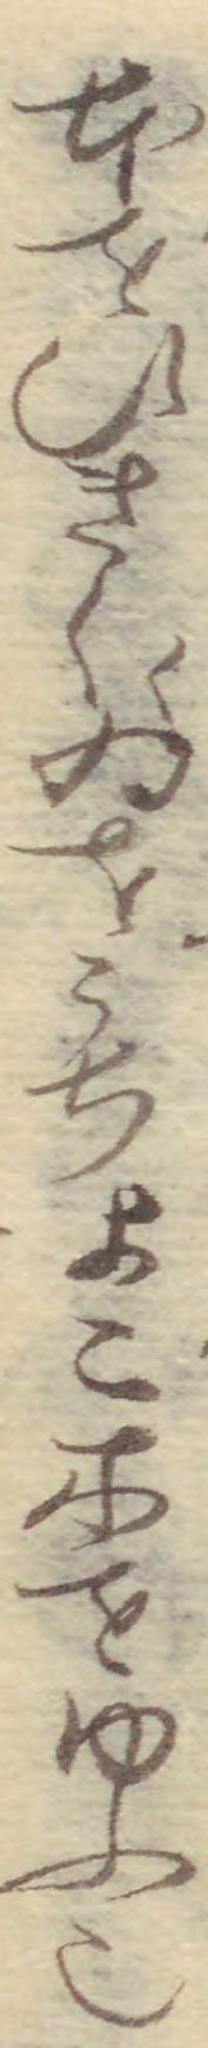本をひきくくゐをうちよこ木をゆふ也
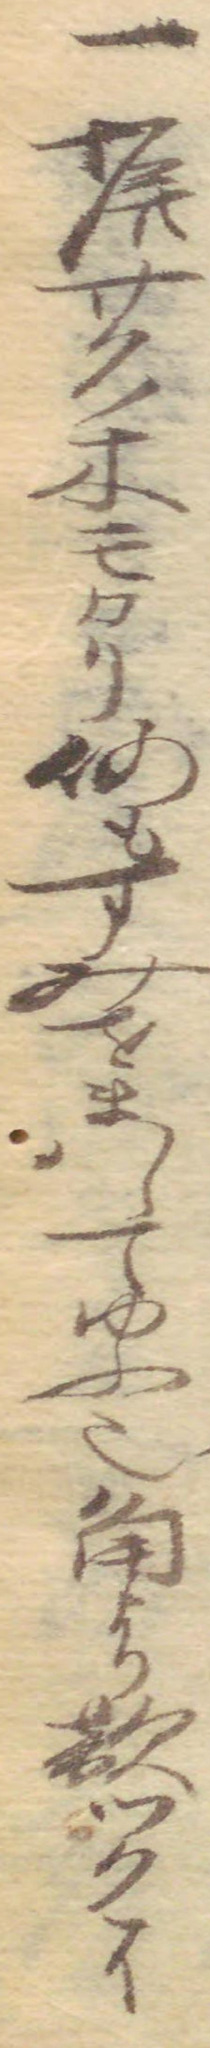一塀サクノ木モカリ何もすみをまハしてゆふ也角より敵ツクに

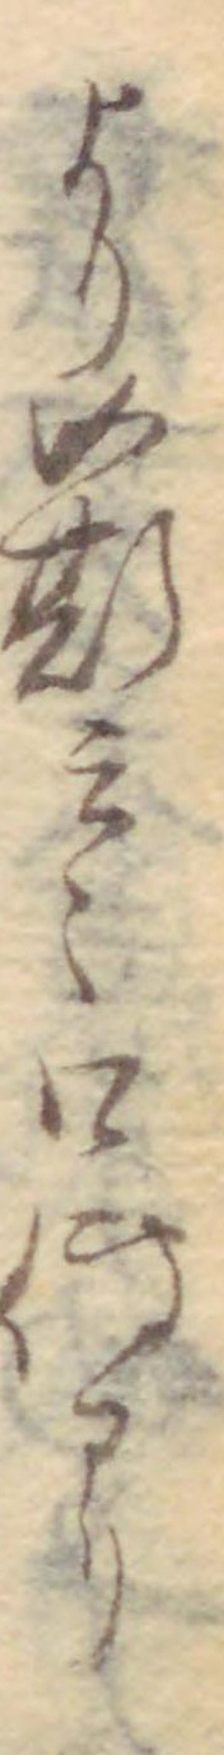より如斯云々口伝アリ
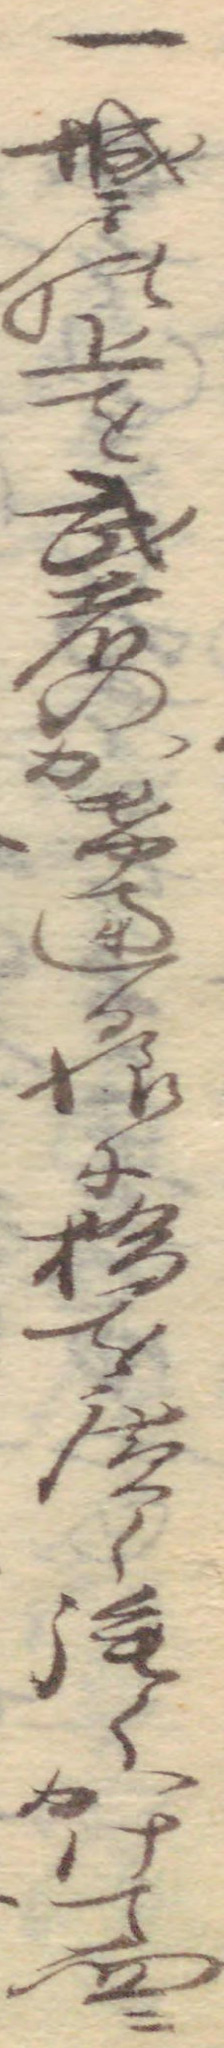一城との上を武者のかけ通る様に橋を広く強くかけて面ニ
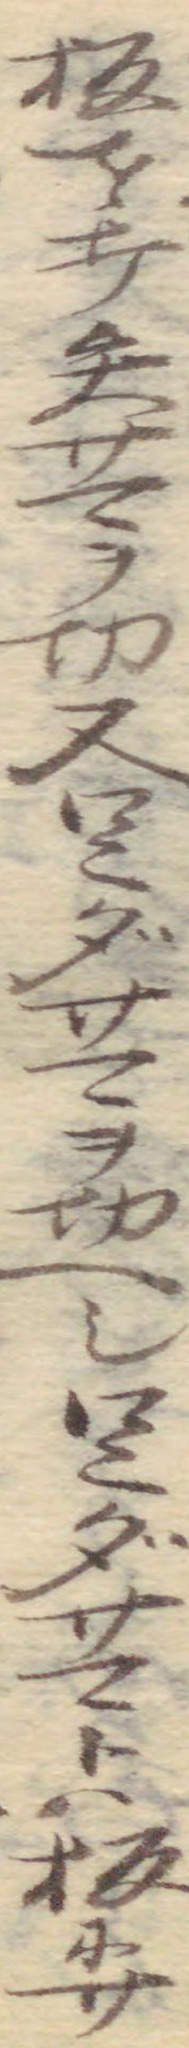板を打矢サマヲ切又足ダサマヲ切ヘシ足ダサマトハ板にサ
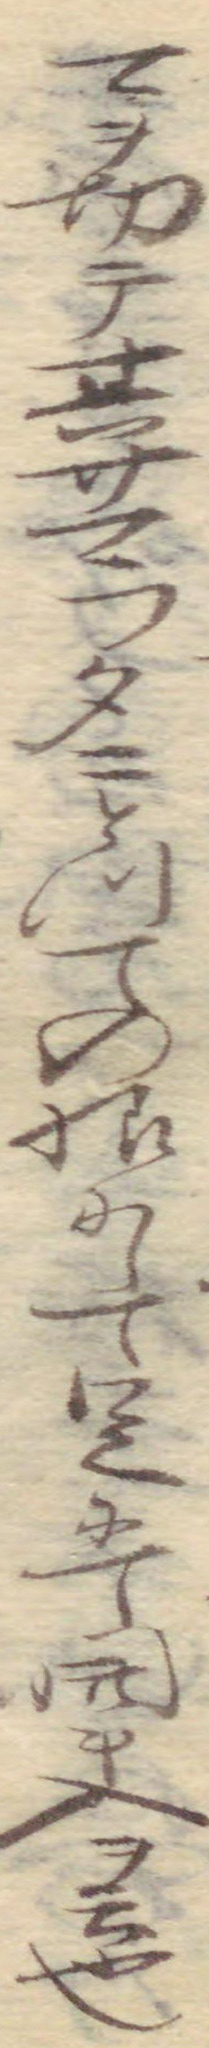マヲキ切テ其サマフタニとつての様にして足にて開キ入ヲ云也
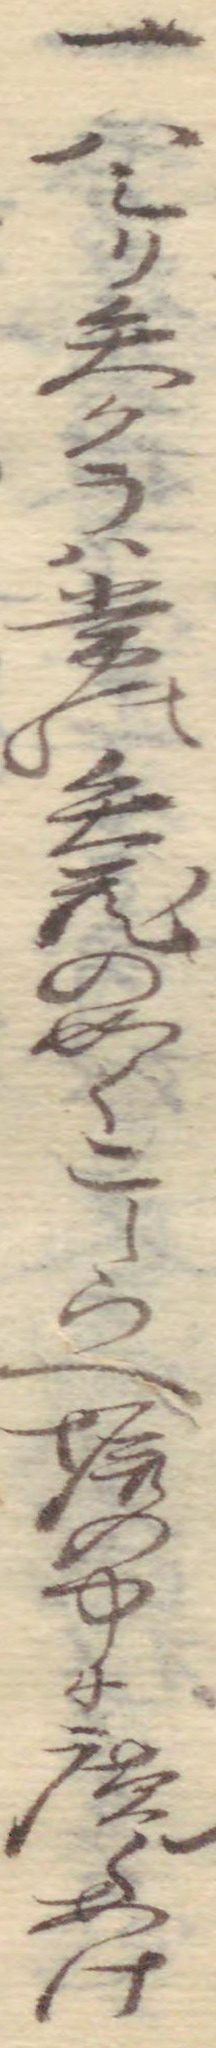一ハシリ矢クラハ常の矢蔵の如くこしらへ塀の中に広くあけ
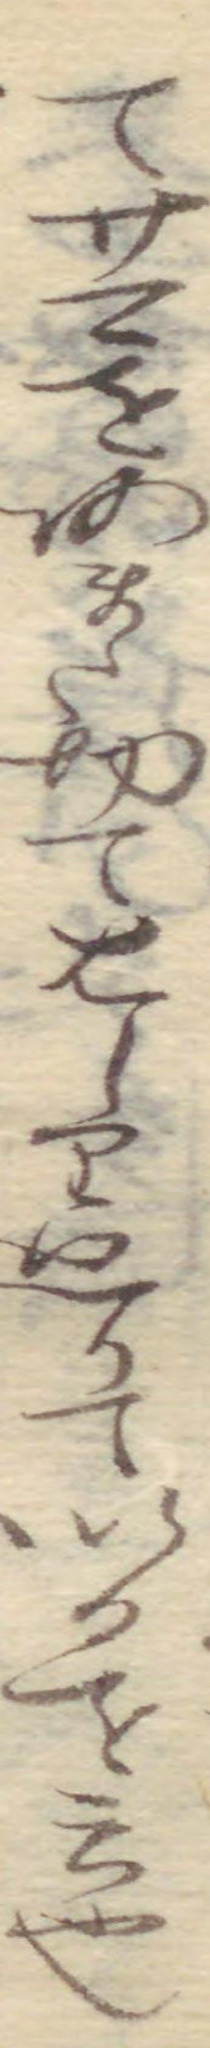てサマをあまた切てはしり廻りているを云也
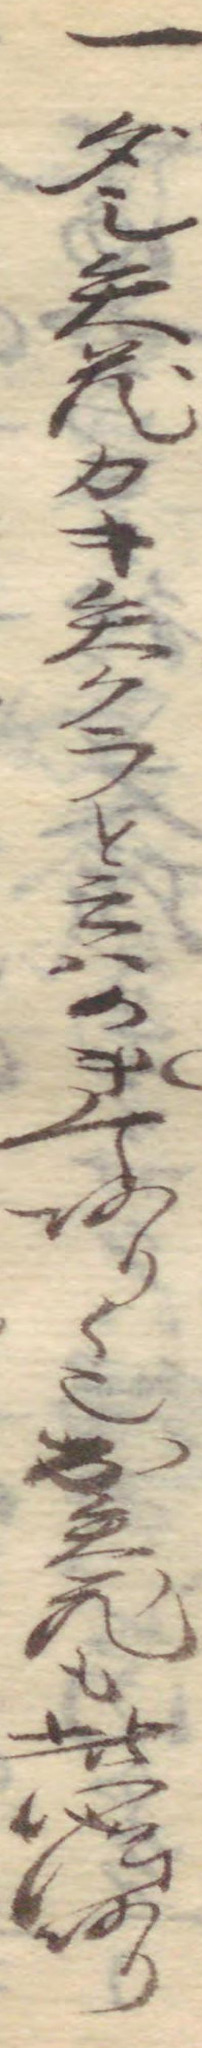一ダシ矢蔵カキ矢クラと云ハかきてありく也出矢蔵も此心得あり
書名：鶯宿雑記. 巻199-200
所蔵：国立国会図書館 National Diet Library, JAPAN
